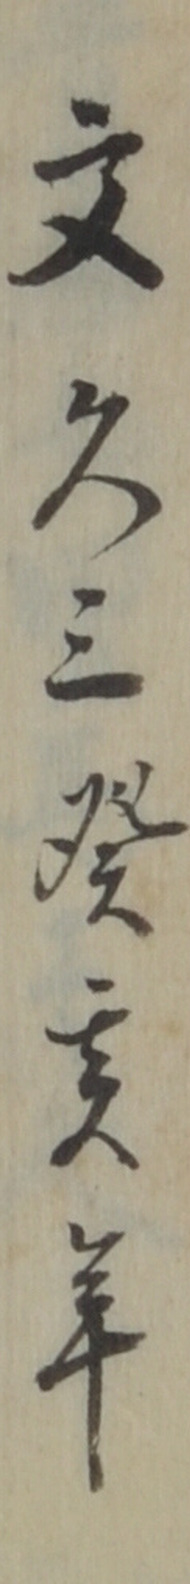文久三癸亥年
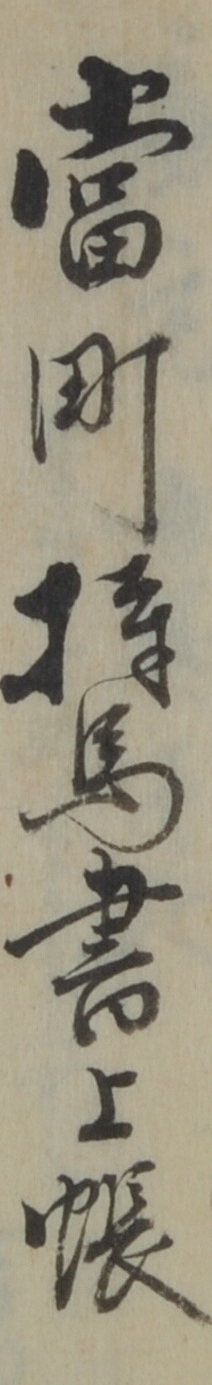当町持馬書上帳
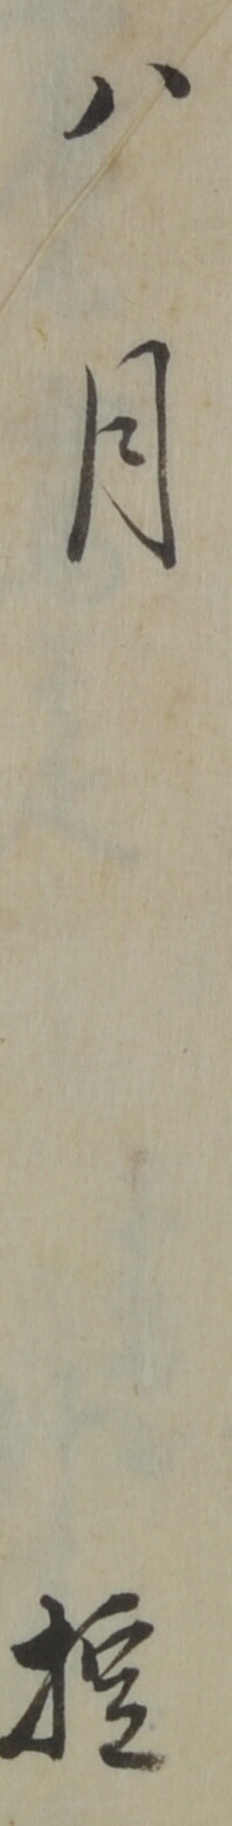八月控

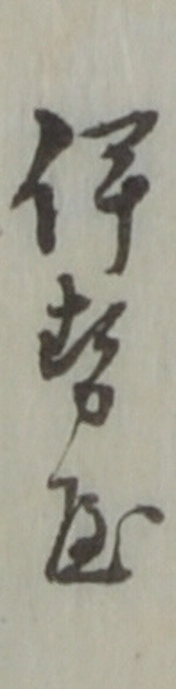伊勢屋
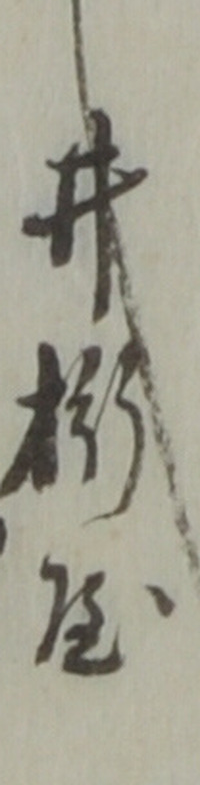井桁屋
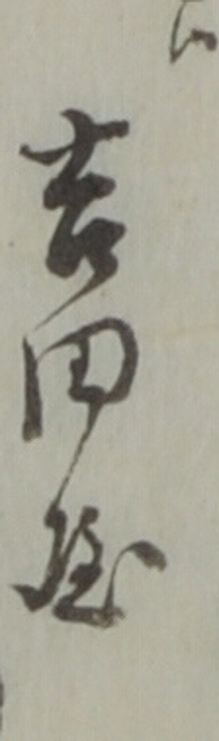吉田屋
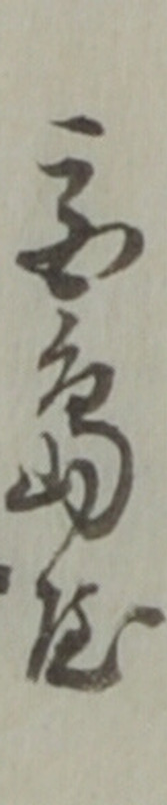宮島屋

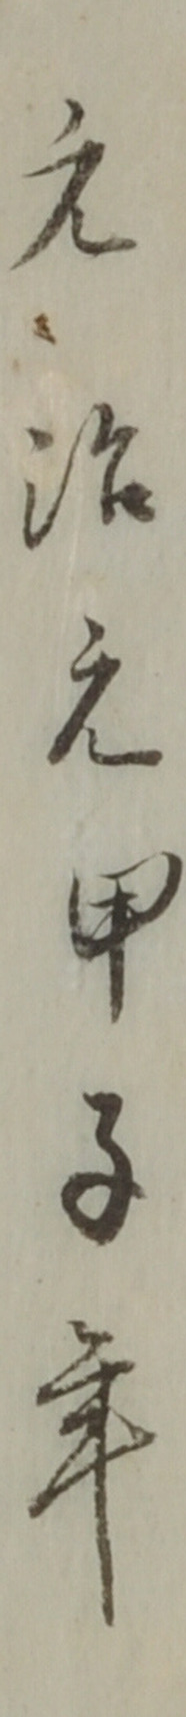元治元甲子年
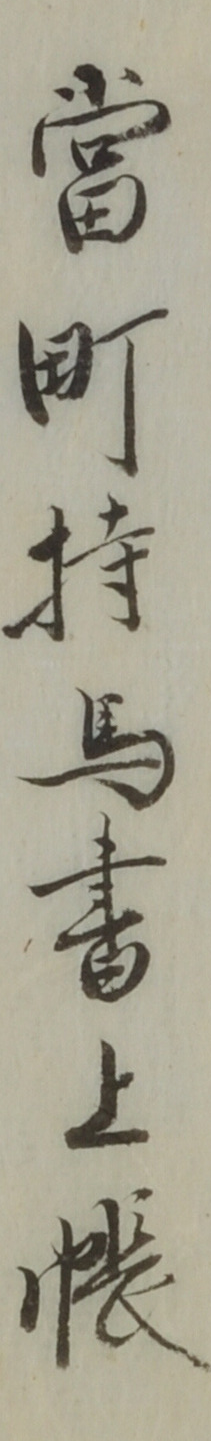当町持馬書上帳

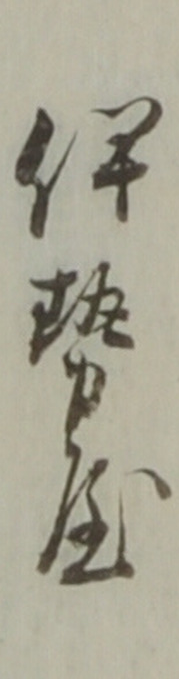伊勢屋
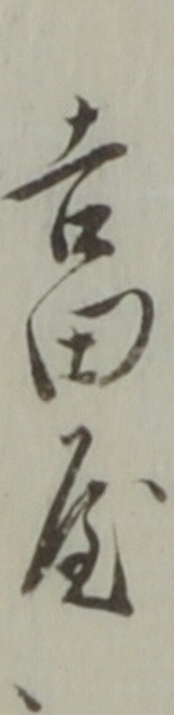吉田屋
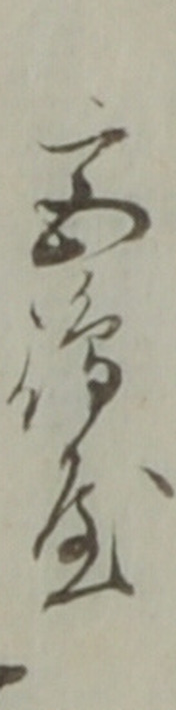宮島屋

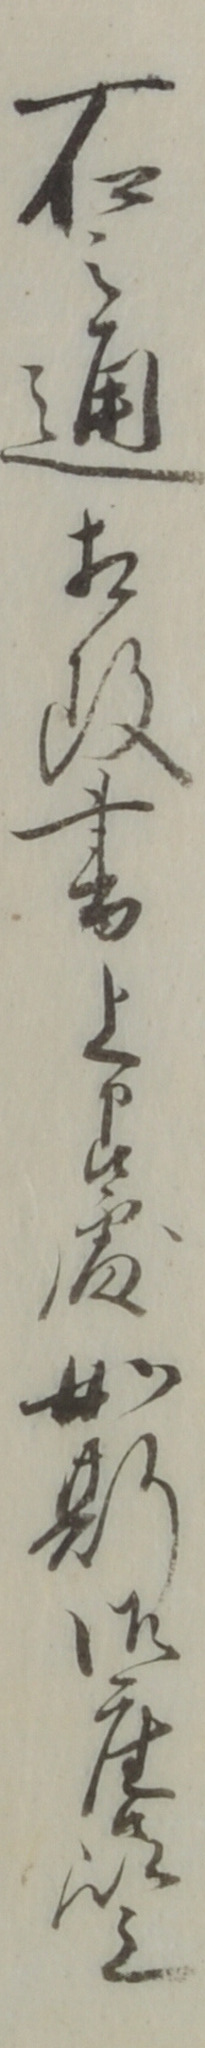右之通相改書上申候処如斯御座以上
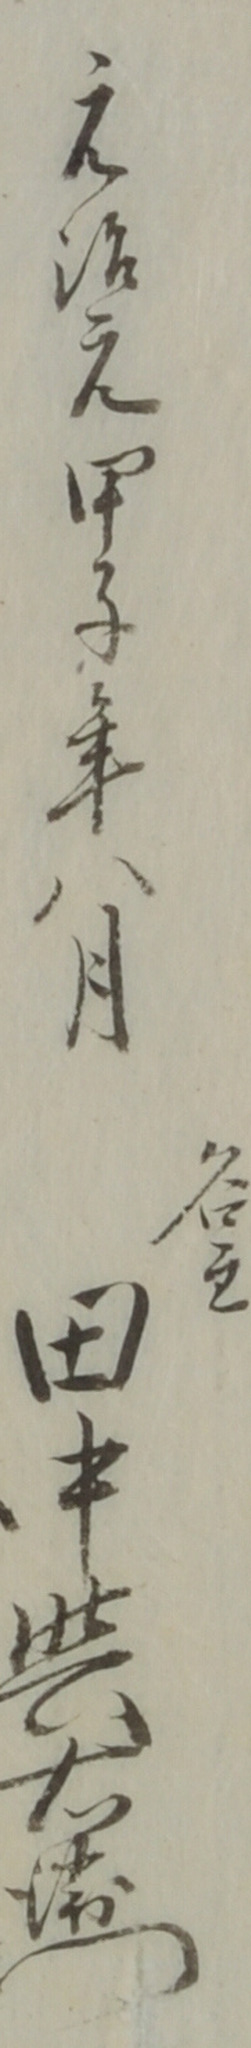元治元甲子年八月田中与右衛門
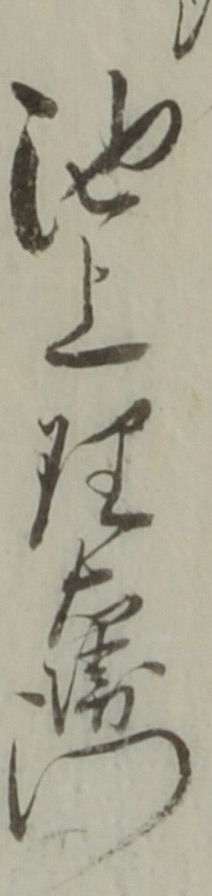池上理右衛門
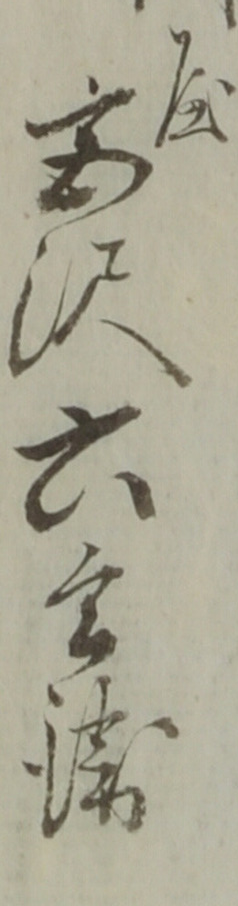宮沢六兵衛
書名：當町持馬書上帳
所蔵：伊那市立高遠町図書館・合同会社AMANE
